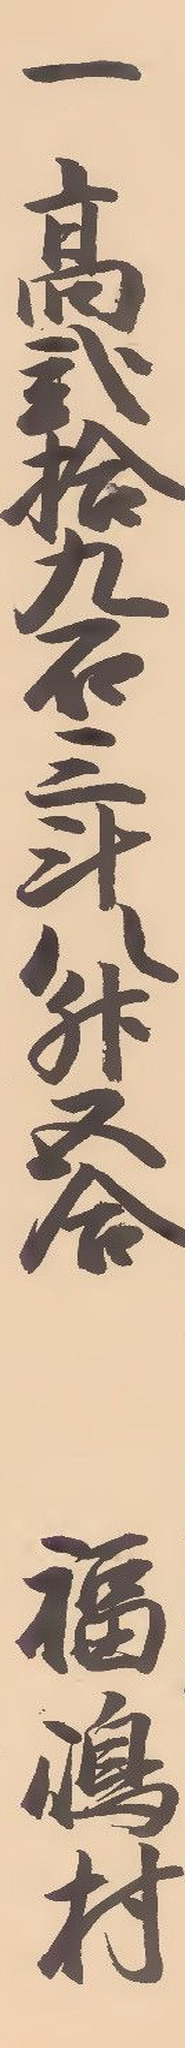一髙弐拾九石三斗八升五合福嶋村

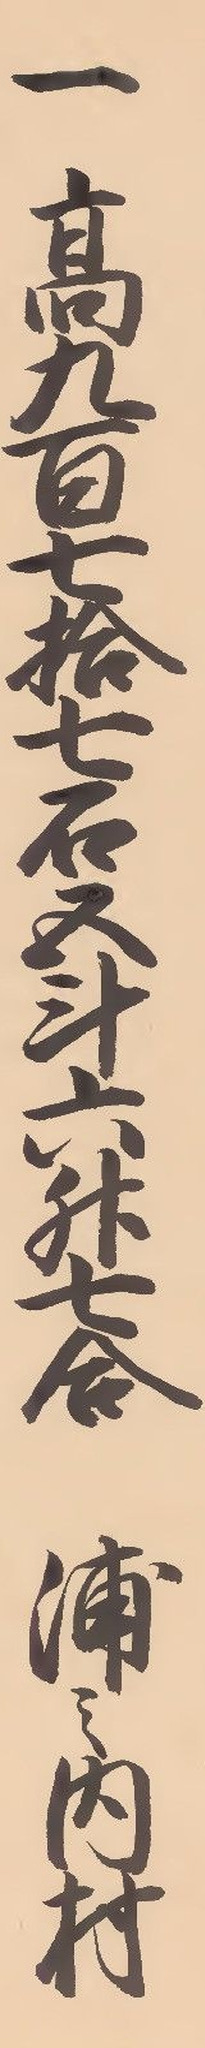一髙九百七拾七石五斗六升七合浦之内村
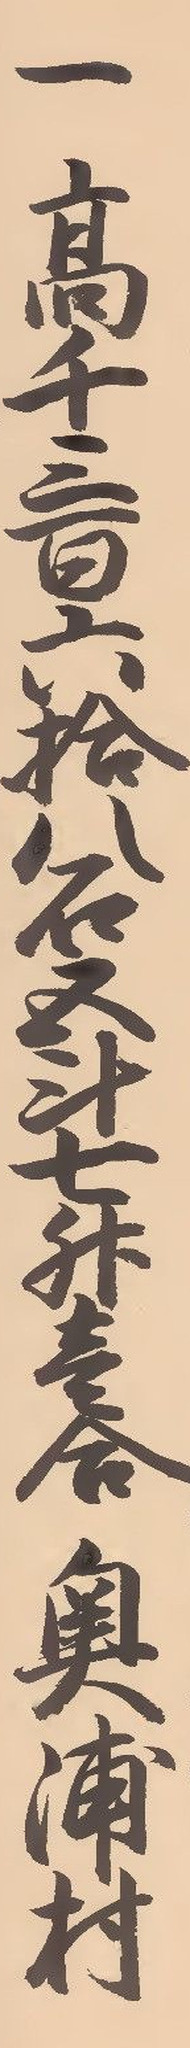一髙千三百六拾八石五斗七升壱合奥浦村
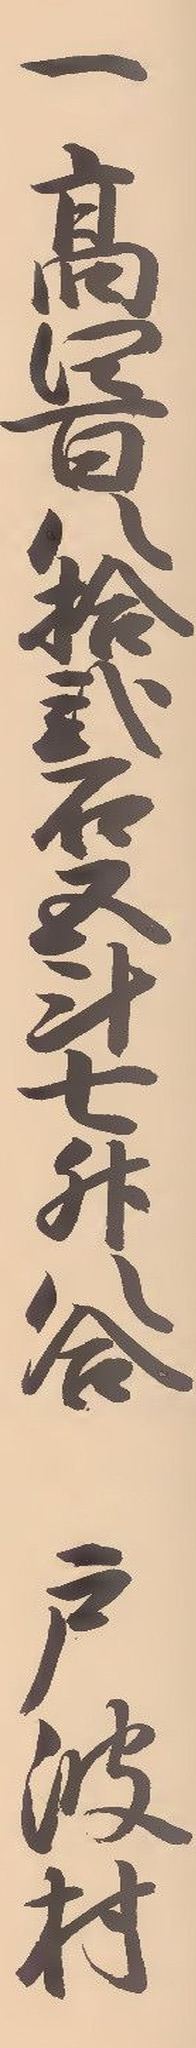一髙四百八拾弐石五斗七升八合戸波村
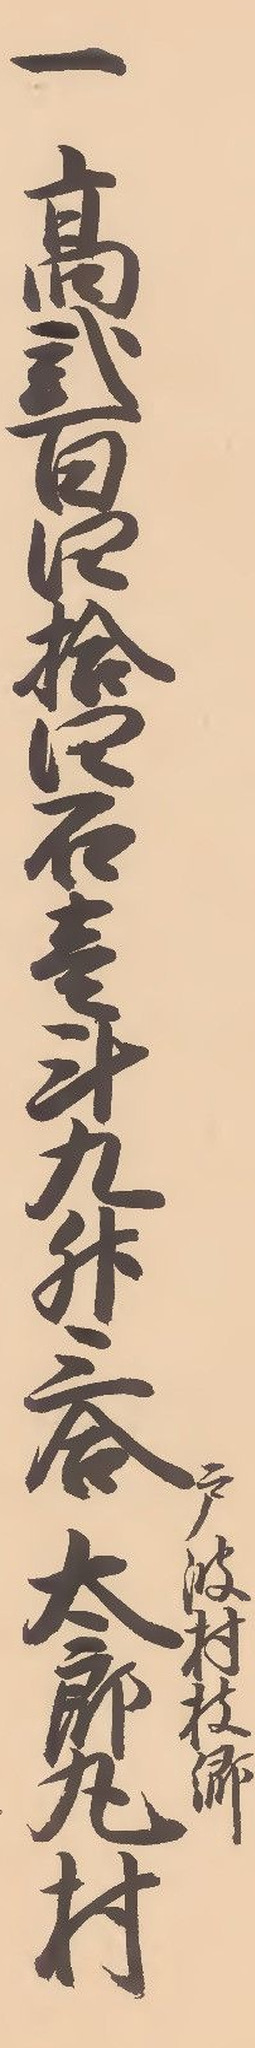一髙弐百四拾四石壱斗九升三合太郎丸村
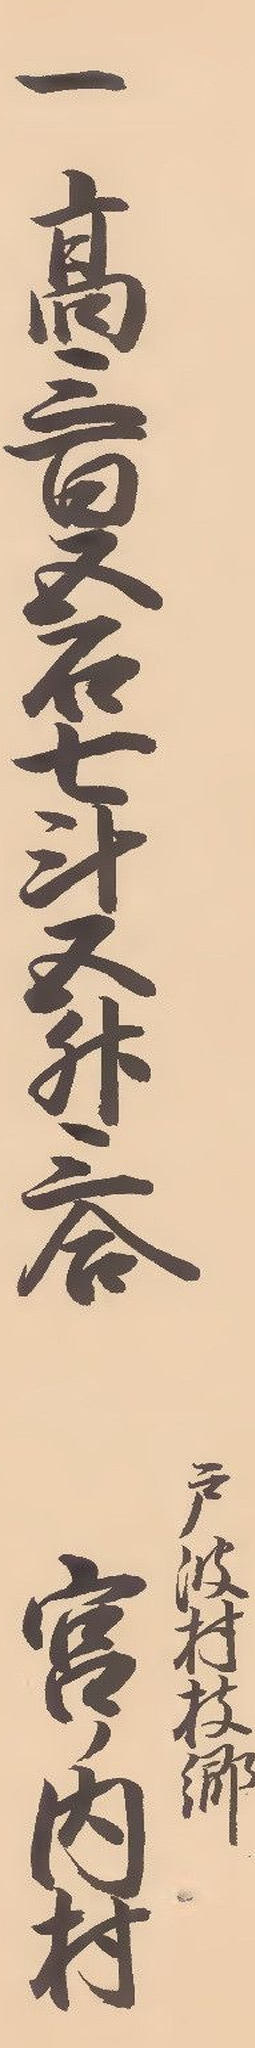一髙三百五石七斗五升三合宮ノ内村
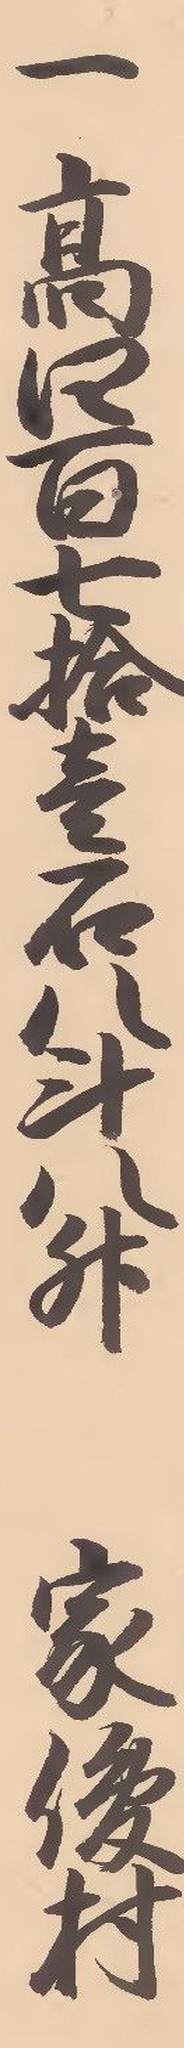一髙四百七拾壱石八斗八升家後村

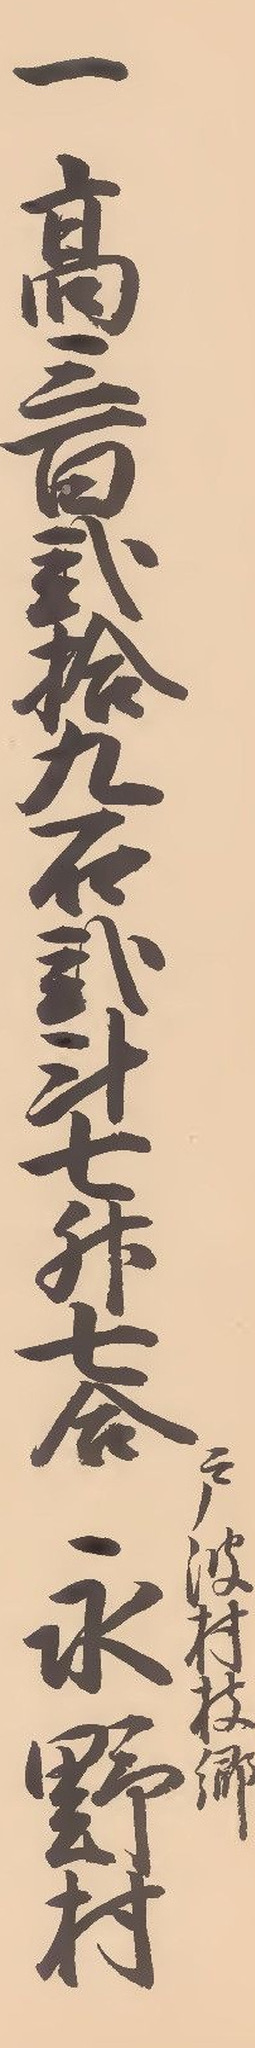一髙三百弐拾九石弐斗七升七合永野村
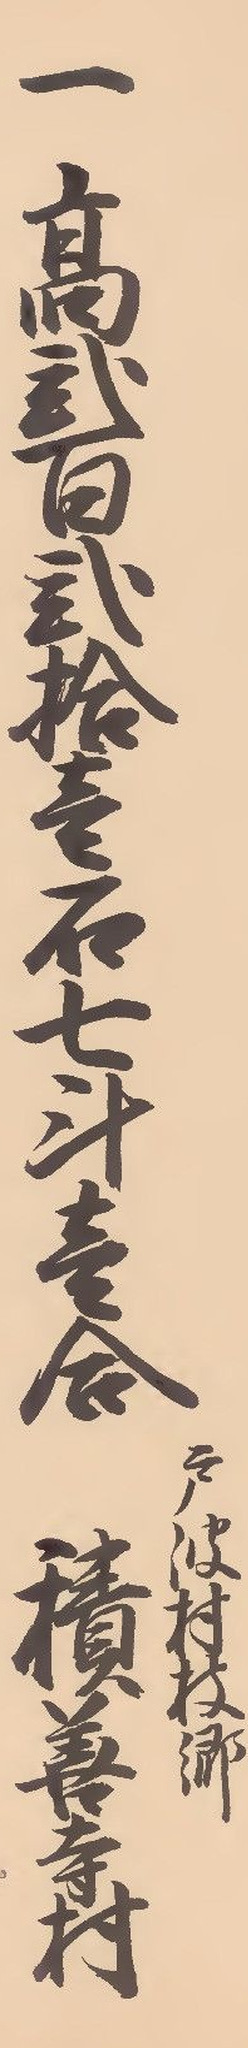一髙弐百弐拾壱石七斗壱合積善寺村
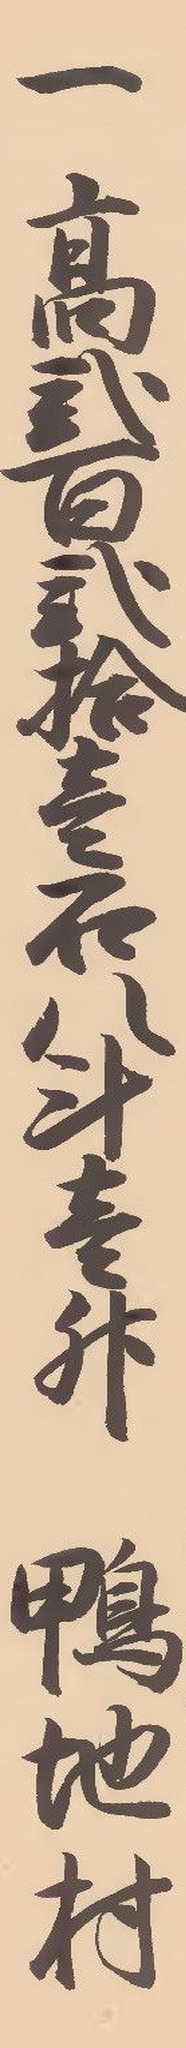一髙弐百弐拾壱石八斗壱升鴨地村
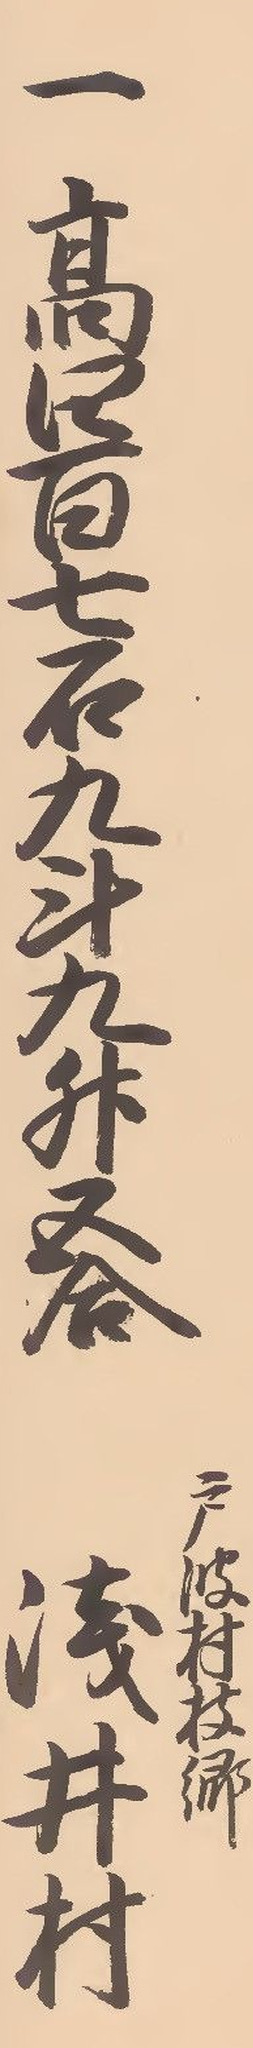一髙四百七石九斗九升五合浅井村
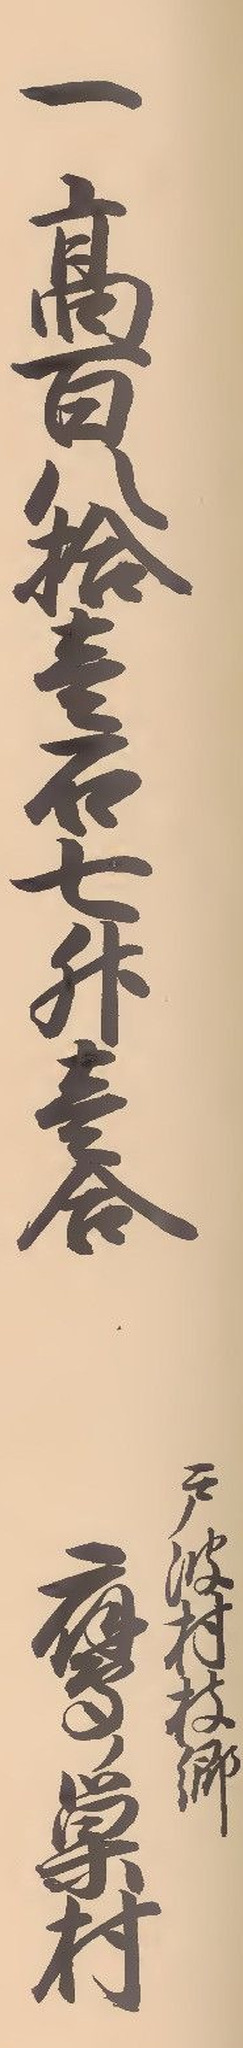一髙百八拾壱石七升壱合鷹ノ巣村
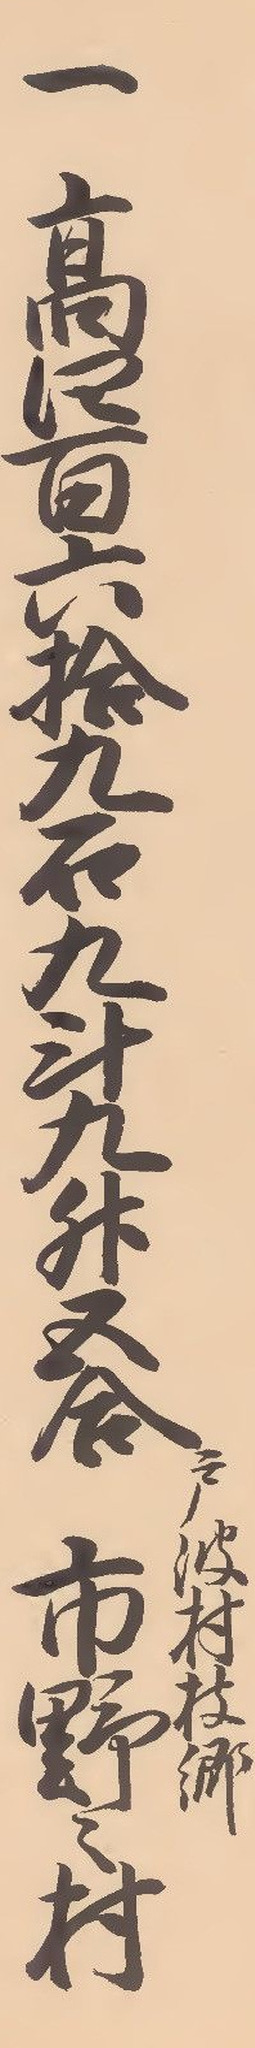一髙四百六拾九石九斗九升五合市野々村
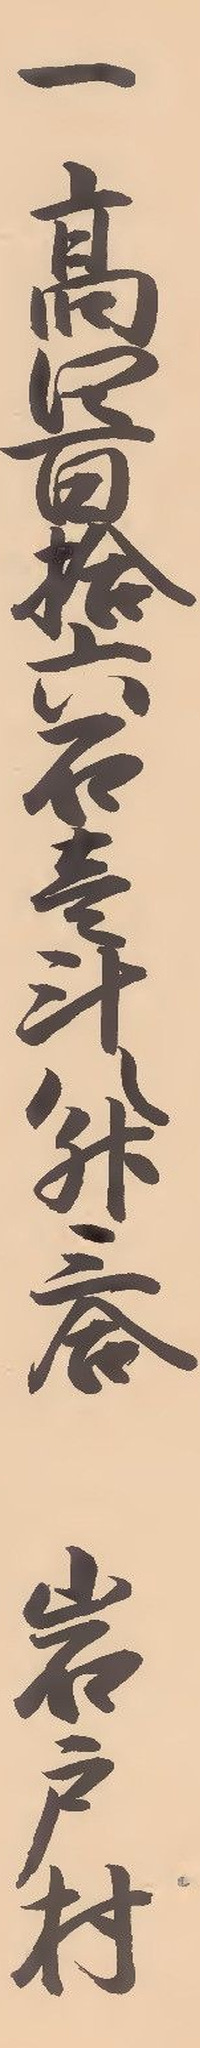一髙四百拾六石壱斗八升三合岩戸村
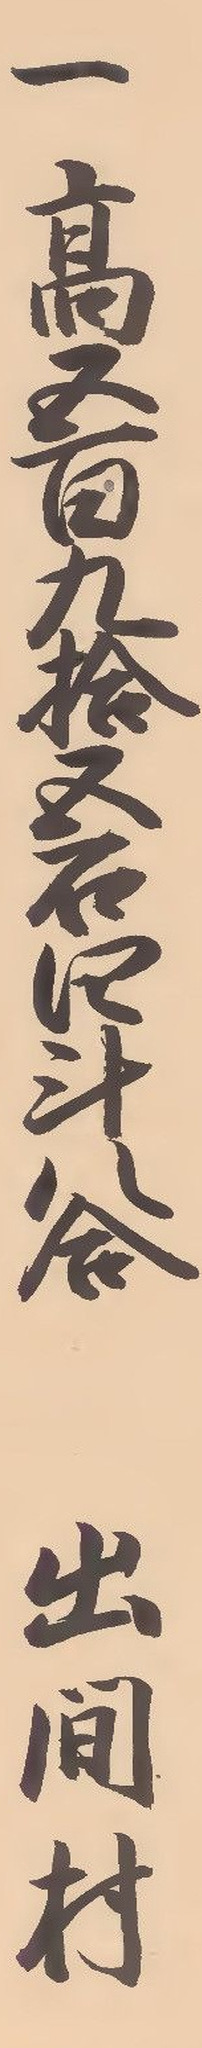一髙五百九拾五石四斗八合出間村

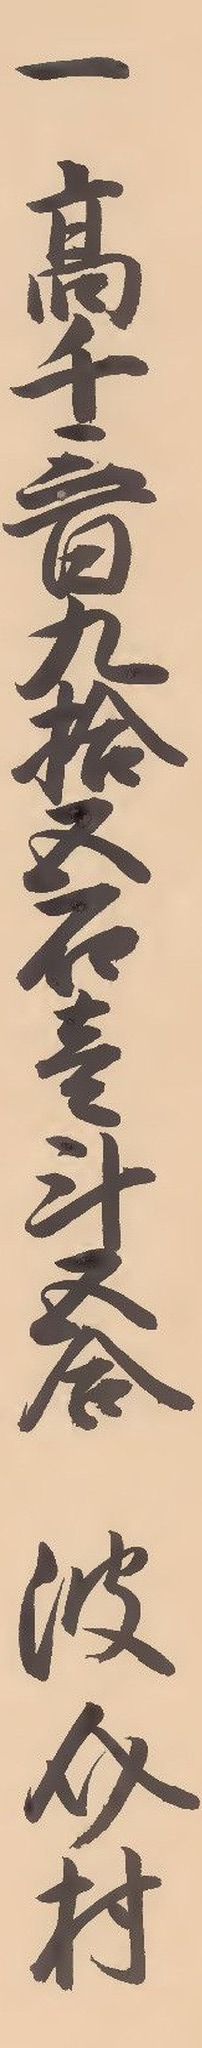一髙千三百九拾五石壱斗五合波介村
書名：土佐国郷帳
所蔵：国立公文書館 National Archives of Japan
